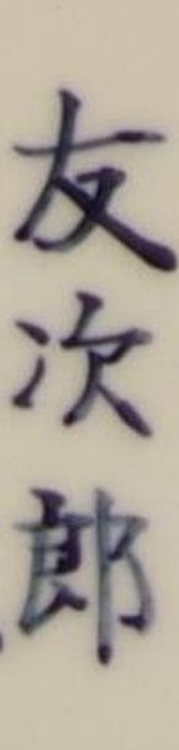友次郎
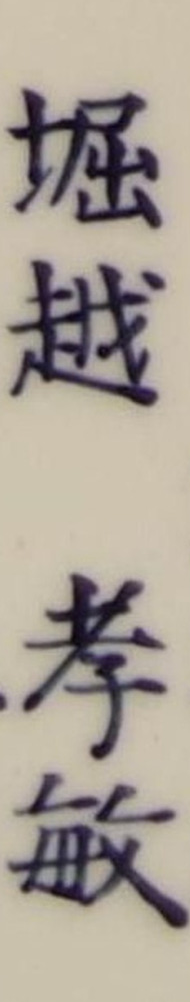堀越孝敏
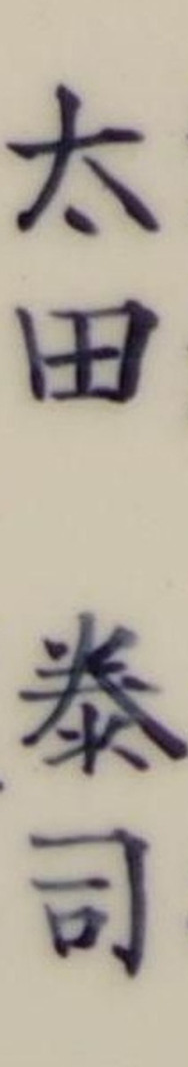太田泰司

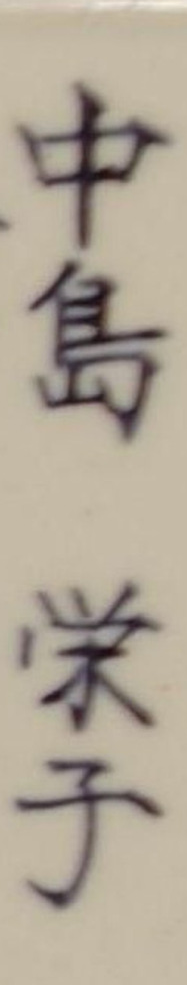中島栄子
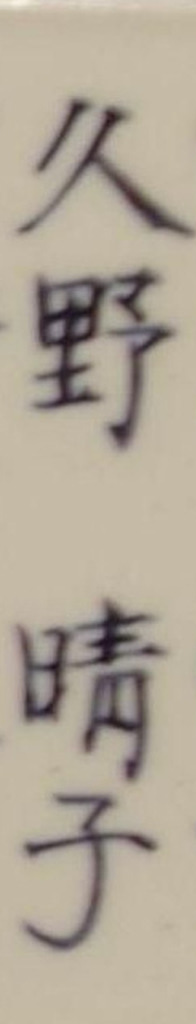久野晴子
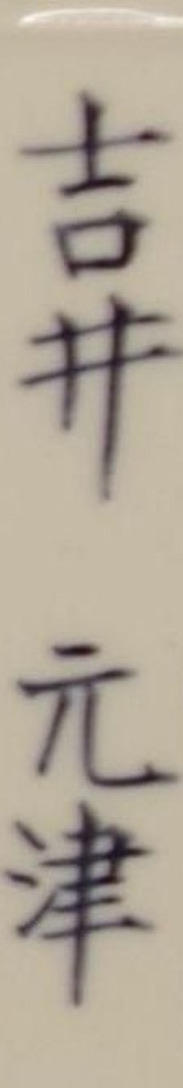吉井元津
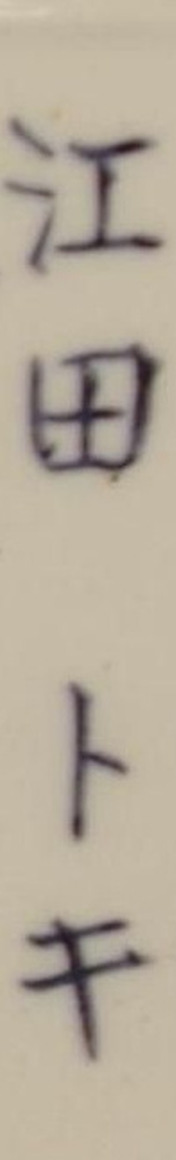江田トキ
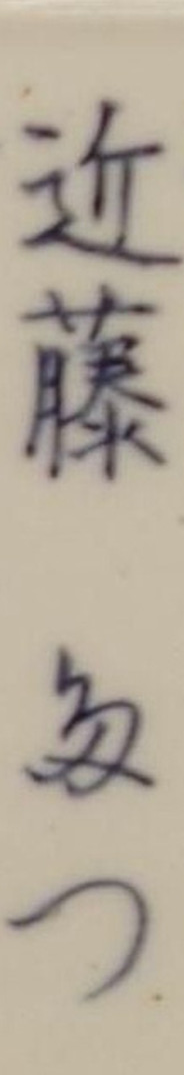近藤たつ
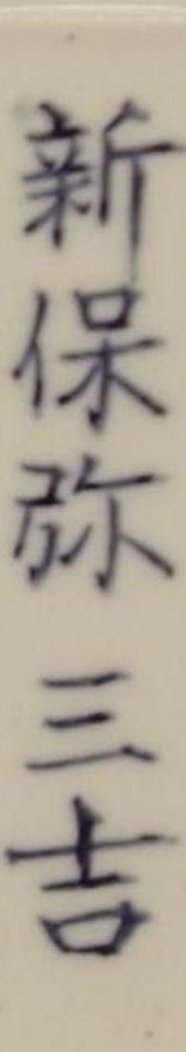新保弥三吉
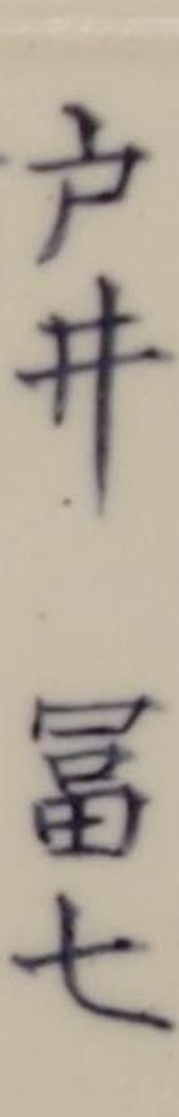戸井冨七
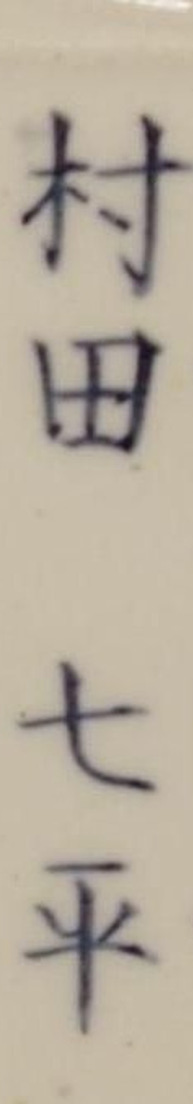村田七平
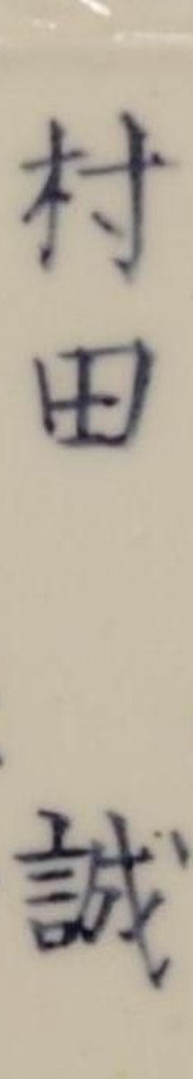村田誠
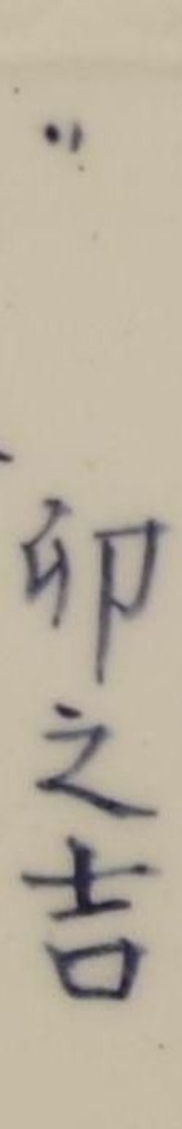卯之吉
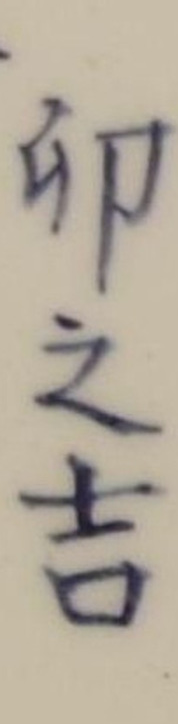卯之吉
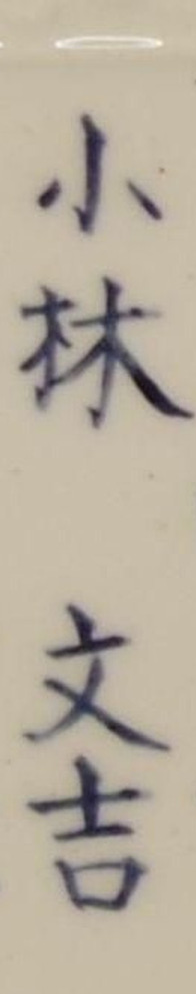小林文吉
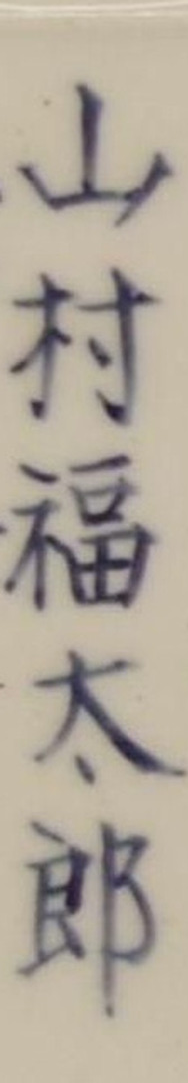山村福太郎
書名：M~S
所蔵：高野山金剛峯寺
